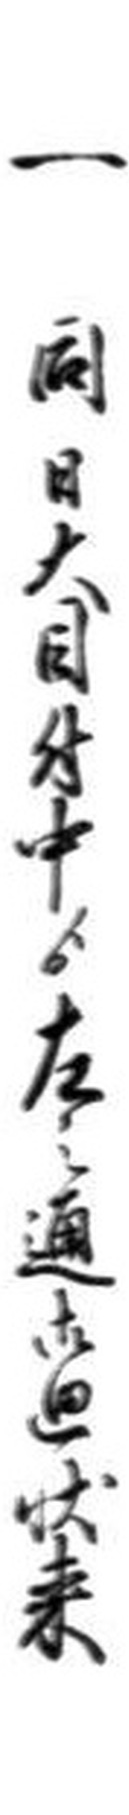一同日大目付中ゟ左之通御廻状来
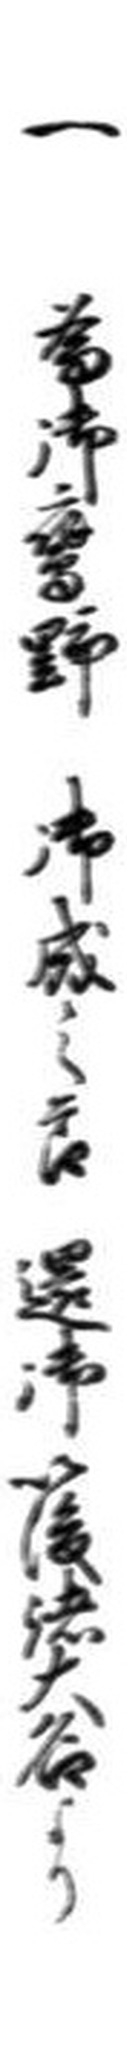一為御鷹野御成之節還御以後諸大名より
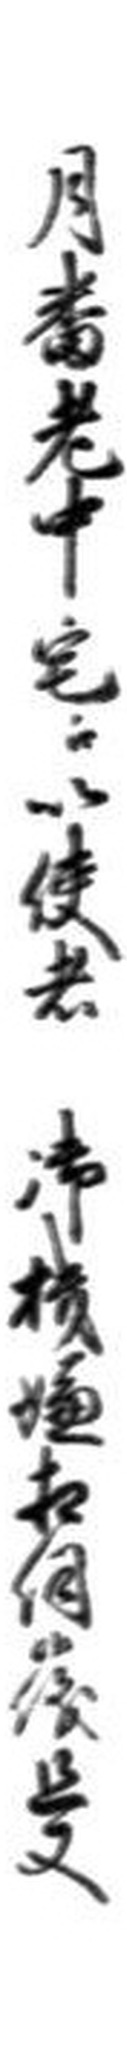月番老中宅江以使者御機嫌相伺候儀且又
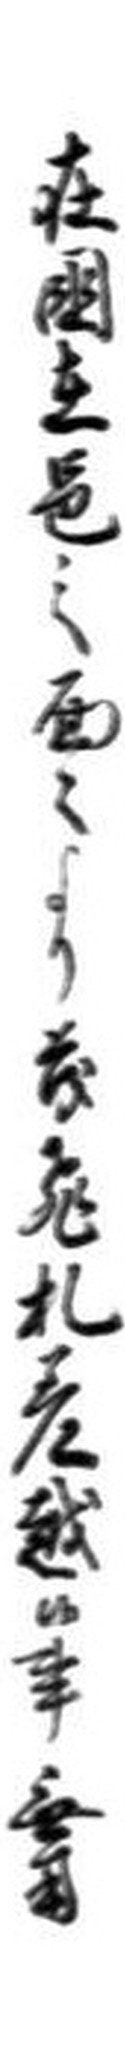在国在邑之面々より茂飛札差越候事無用
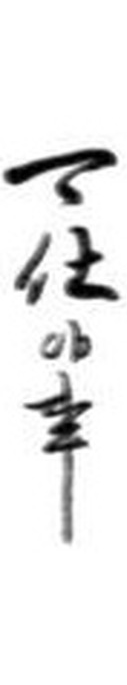可仕候事
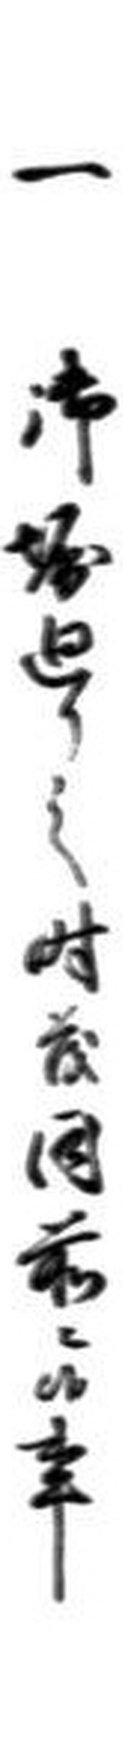一御堀廻り之時茂同前ニ候事
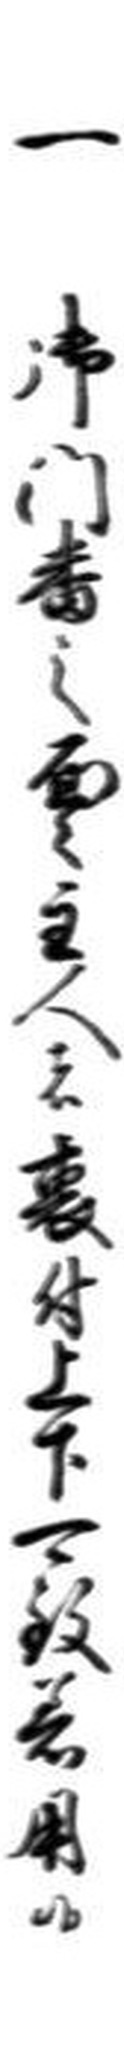一御門番之面々主人者裏付上下可致着用候

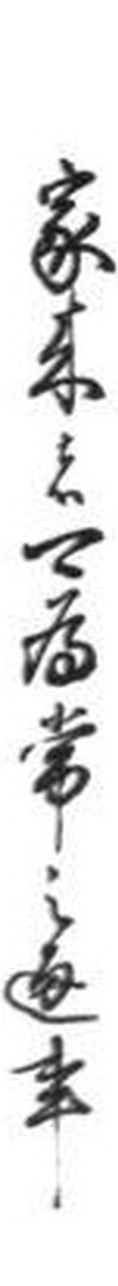家来者可為常之通事
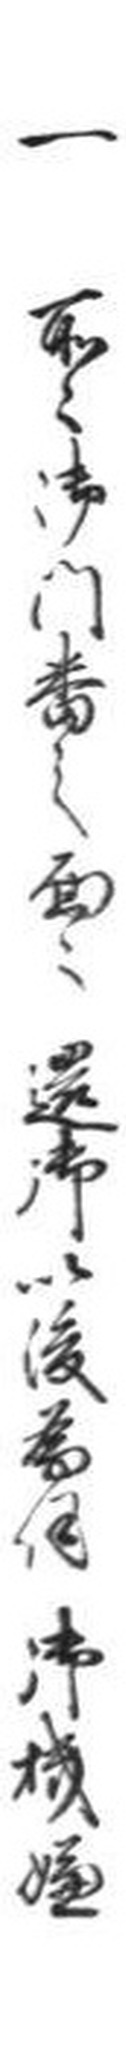一所々御門番之面々還御以後為伺御機嫌
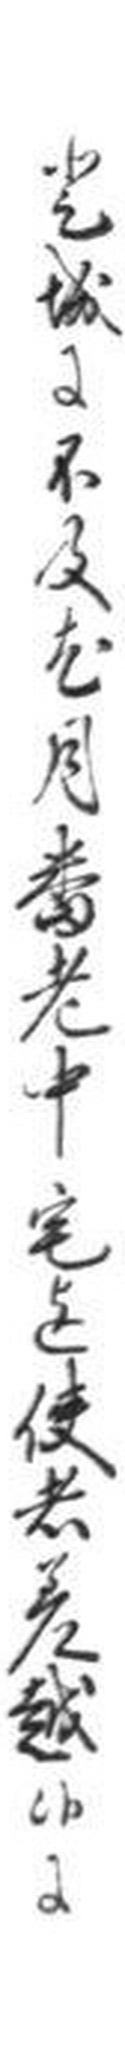登城に不及尤月番老中宅迄使者差越候に
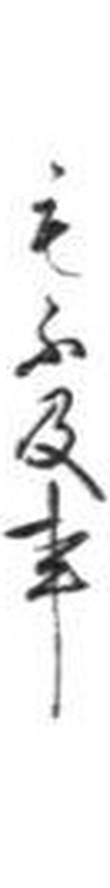も不及事
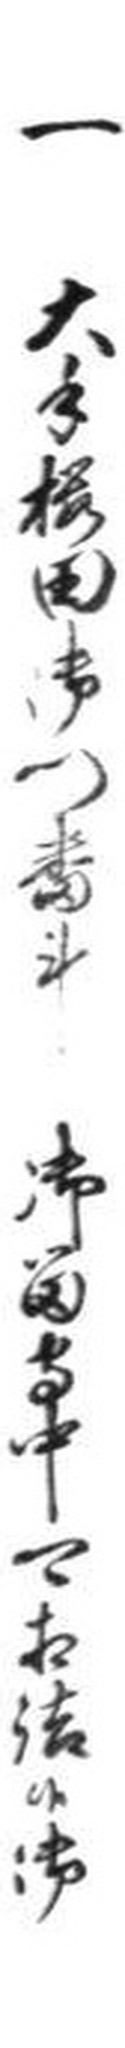一大手桜田御門番斗御留守中可相詰候御
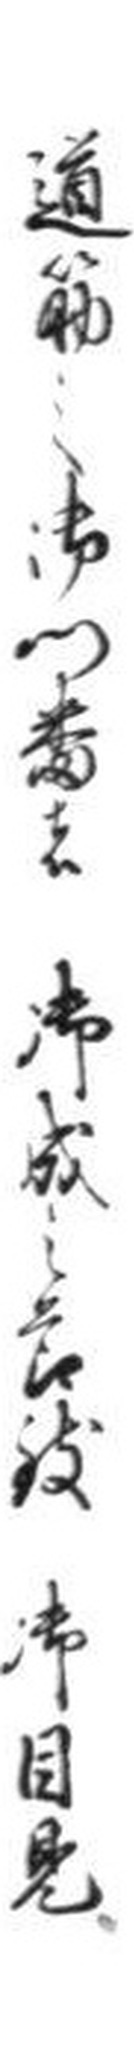道筋之御門番者御成之節致御目見
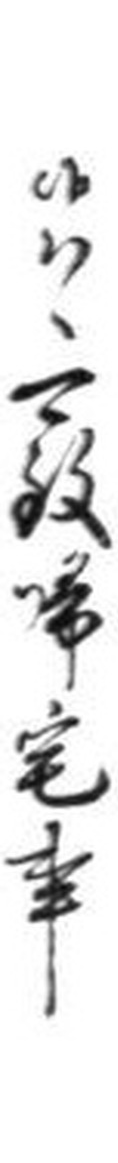候ハヽ可致帰宅事
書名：家譜 三十二 吉邦公 従享保二年到享保三年
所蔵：福井県文書館 Fukui Prefectural Archives
